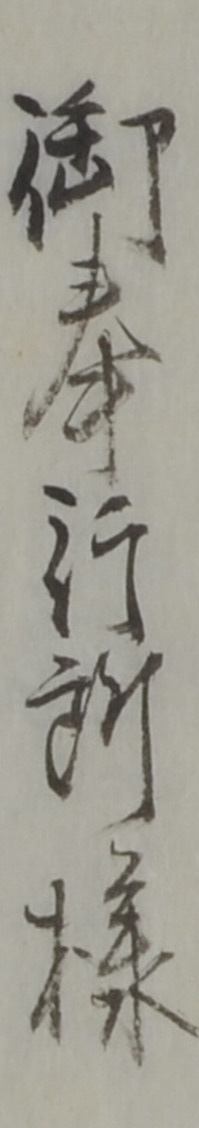御奉行所様
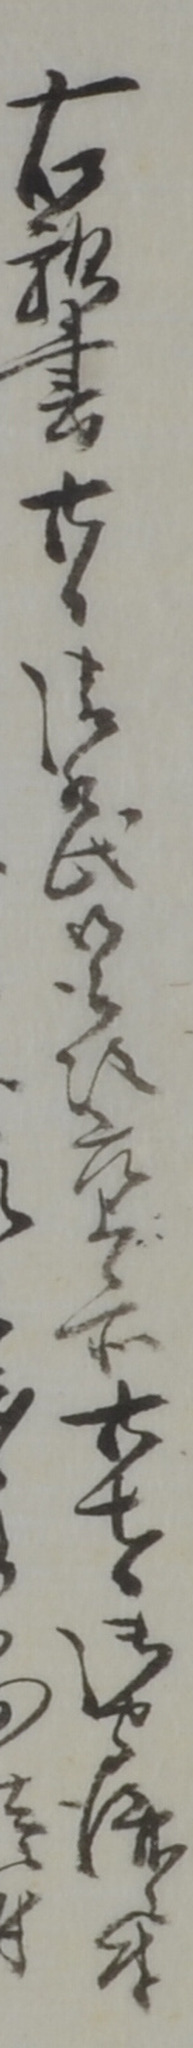右願書廿日清水氏御取次差上候所廿七日御聞済ニ付
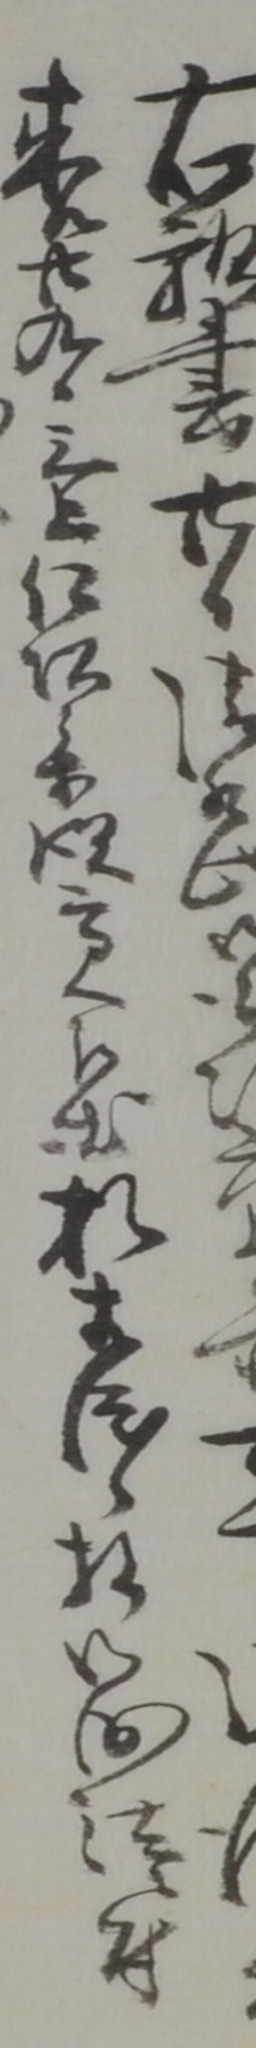来ル廿九日三上仁次兵衛様方へ罷出札相渡候様御沙汰ニ付
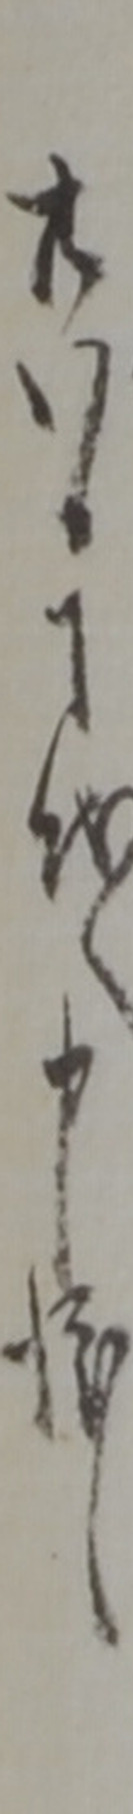廿八日丁代へ申渡候
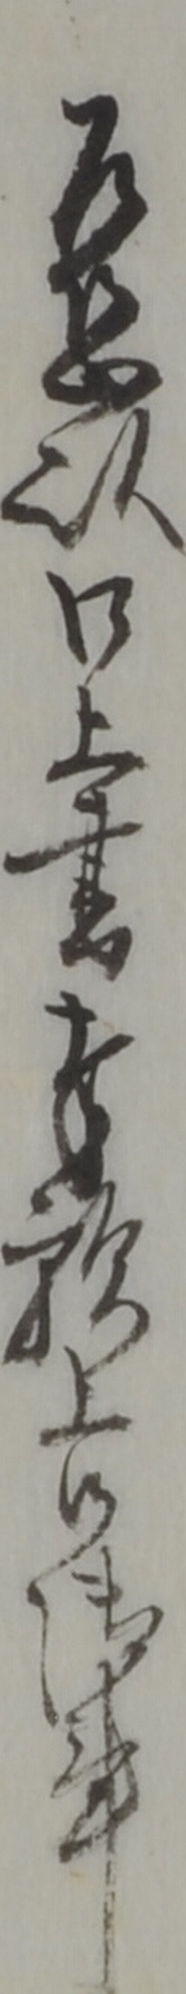乍恐以口上書奉願上候御事
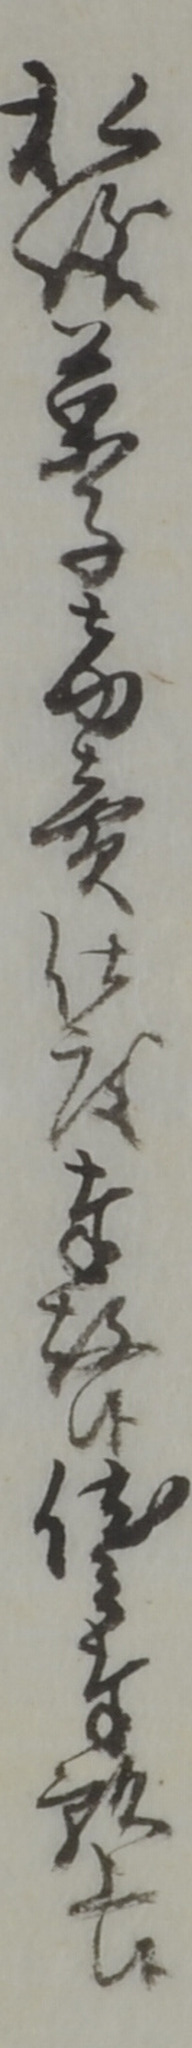私儀菓子商売仕度奉存候依之奉願上候
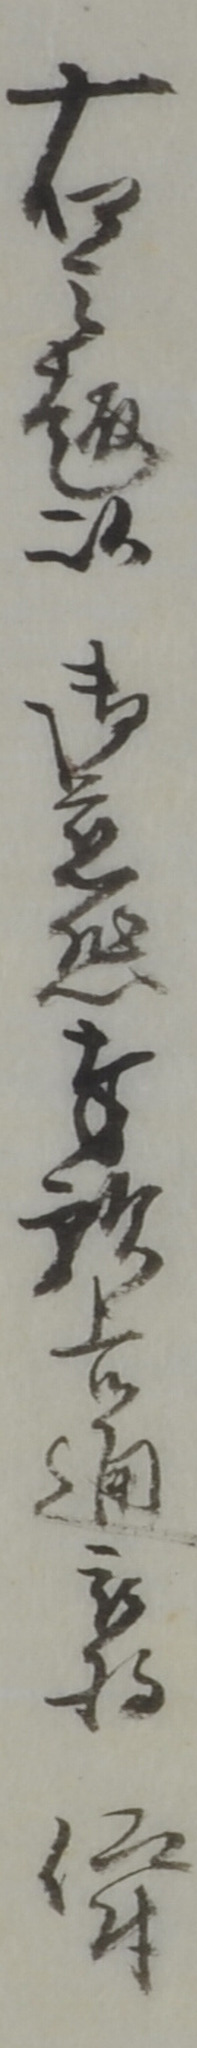右之趣以御慈悲奉願上候通被為仰付
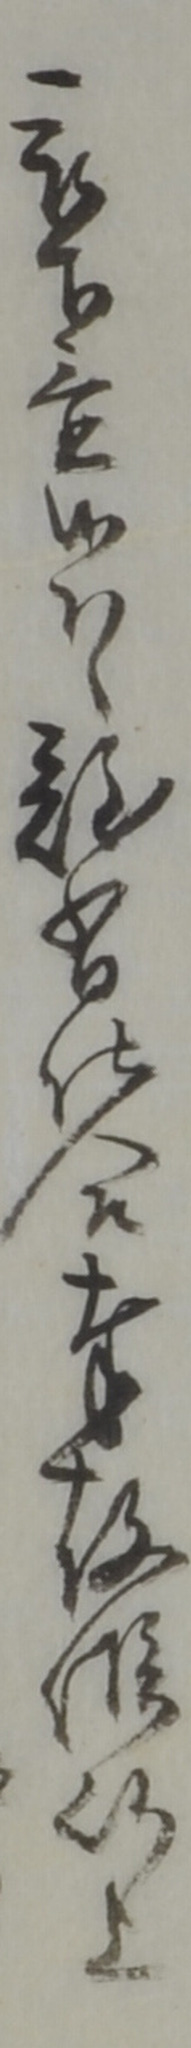被下置候ハヽ難有仕合奉存候以上
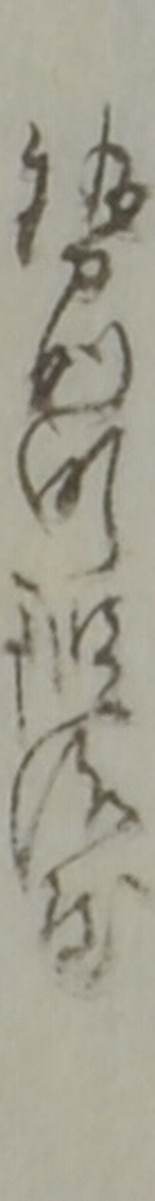勢利町鍛冶屋
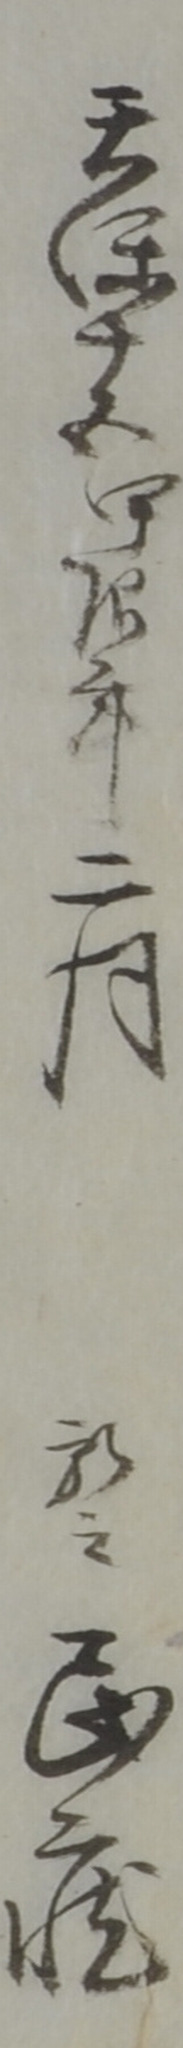天保十五甲辰年二月願主民蔵
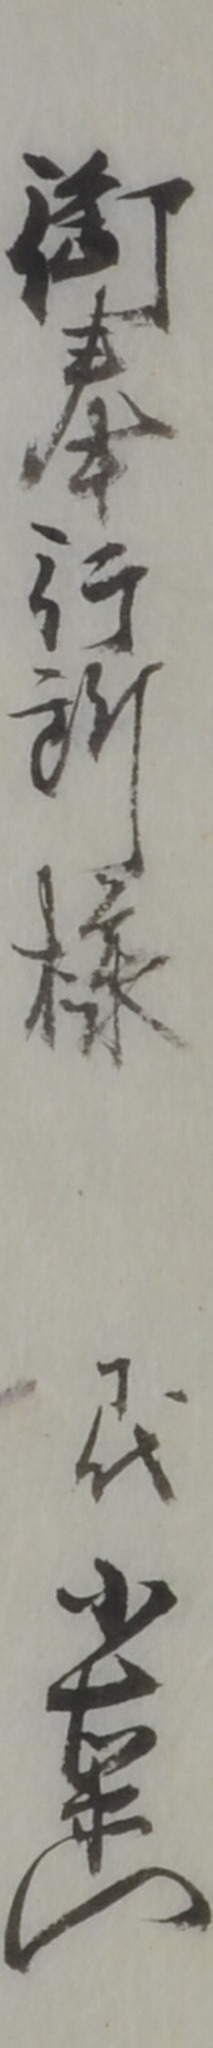御奉行所様丁代小右衛門
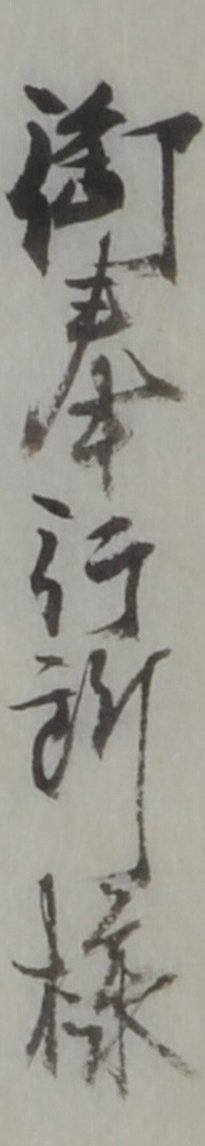御奉行所様
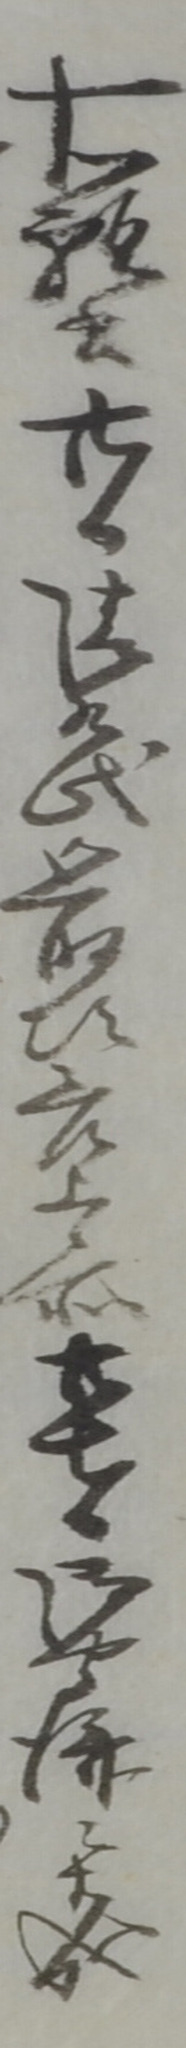右願書廿日清水氏御取次差上候所廿七日御聞済ニ被成
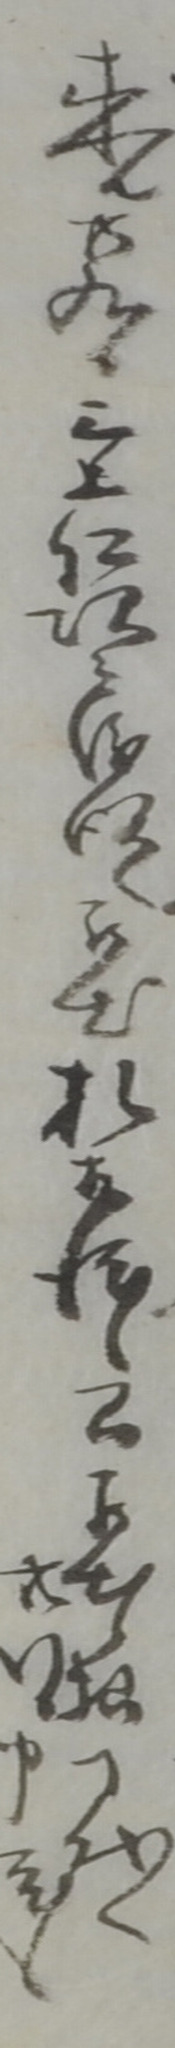来ル廿九日三上仁次兵衛様へ罷出札相渡候間罷出候様丁代へ

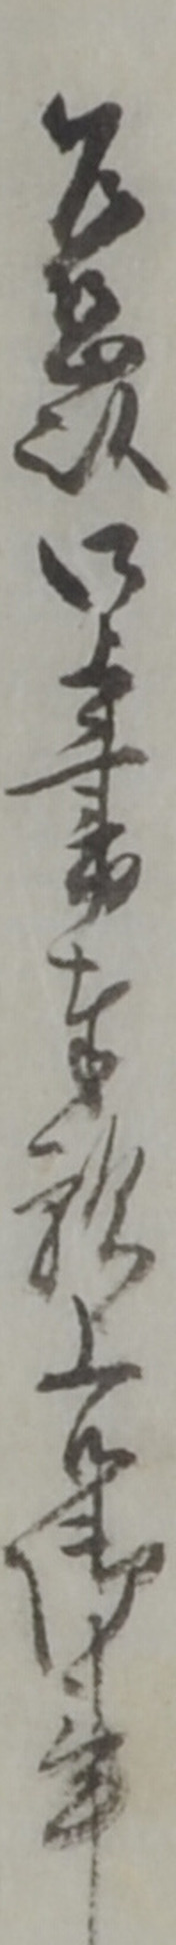乍恐以口上書奉願上候御事
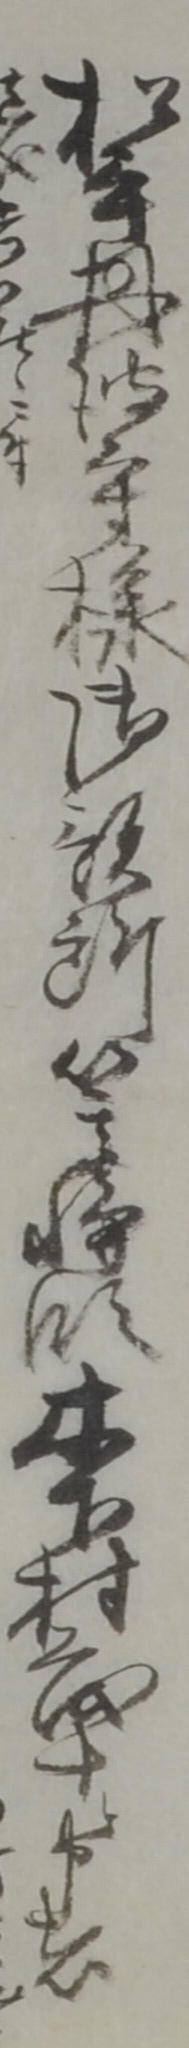松平丹波守様御預所箕輪領木下村茂十と申者
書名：諸願書控簿
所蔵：伊那市立高遠町図書館・合同会社AMANE
